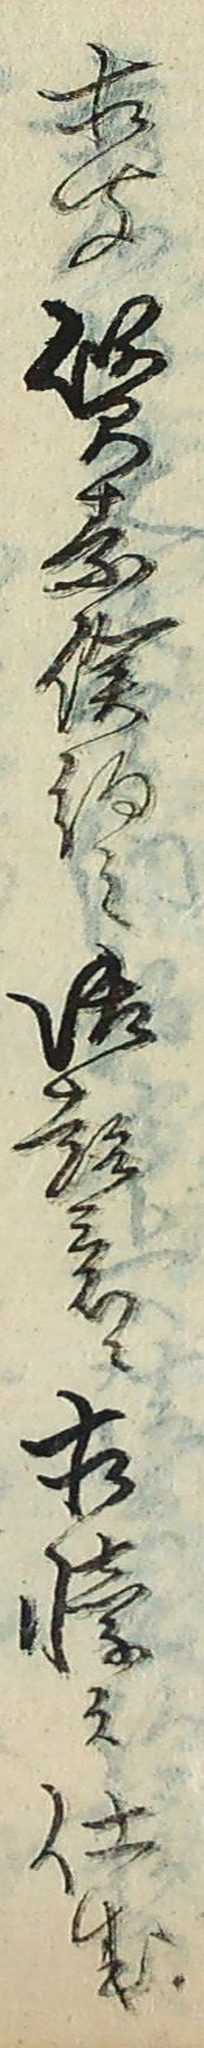相聞質素倹約之御趣意ニ相悖候仕成
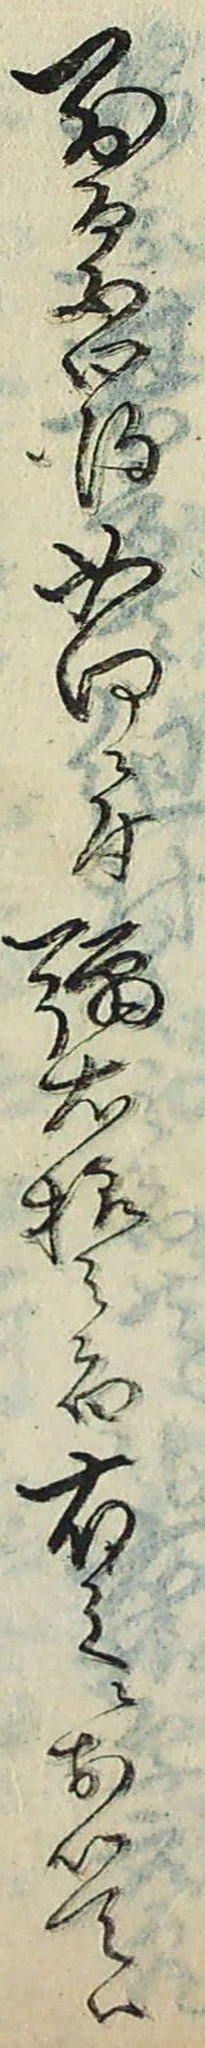別而不心得如何ニ付彌右様之者有之ニおいてハ
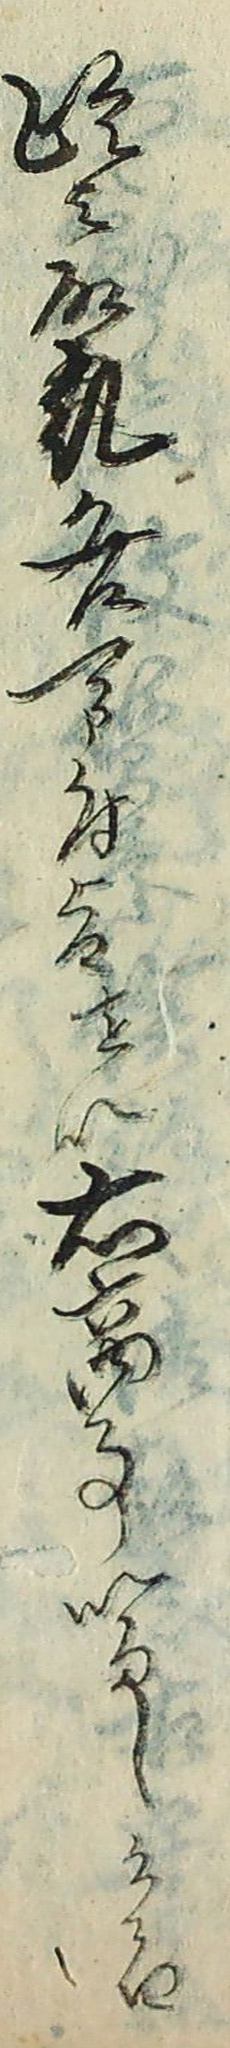屹と取糺咎可申付旨を以右商事いたし候者
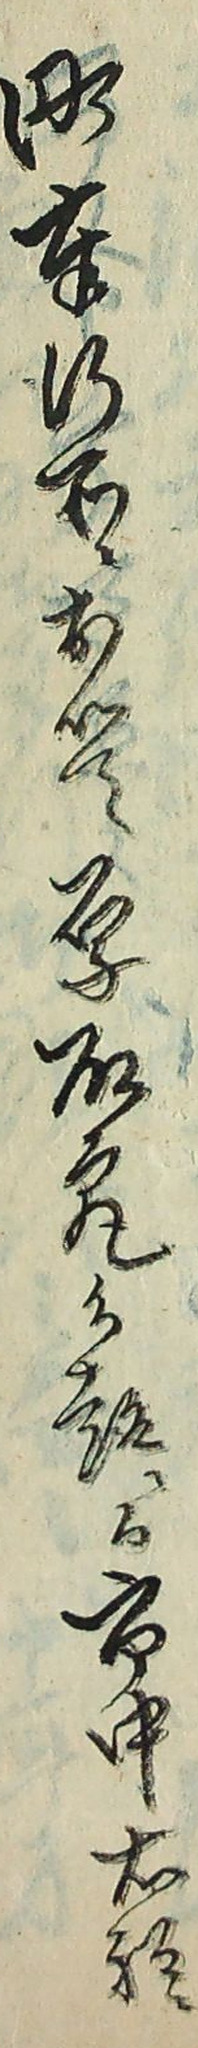町奉行所ニおいて厚取究候趣ニ而市中右程ニ
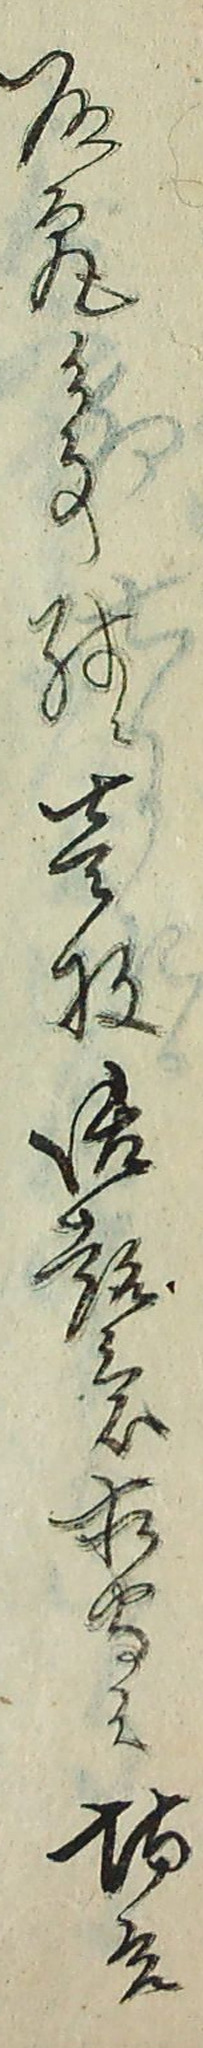取究候事殊ニ壱牧御趣意相聞候場合
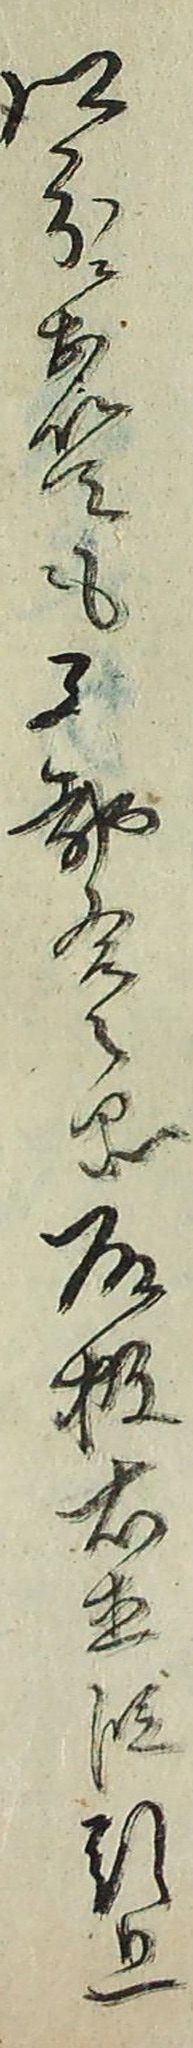郷分ニおいても不都合之品取扱右直段引上
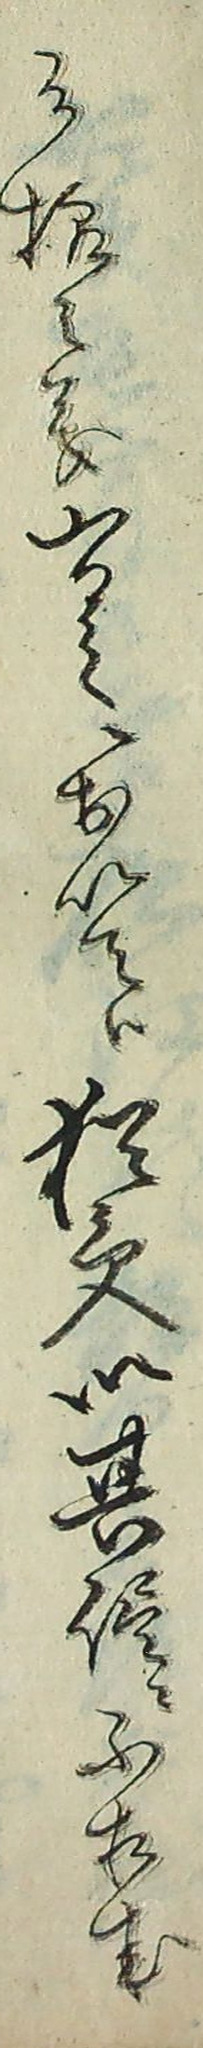候様之義有之ニおいてハ猶更以其儘ニ不相成
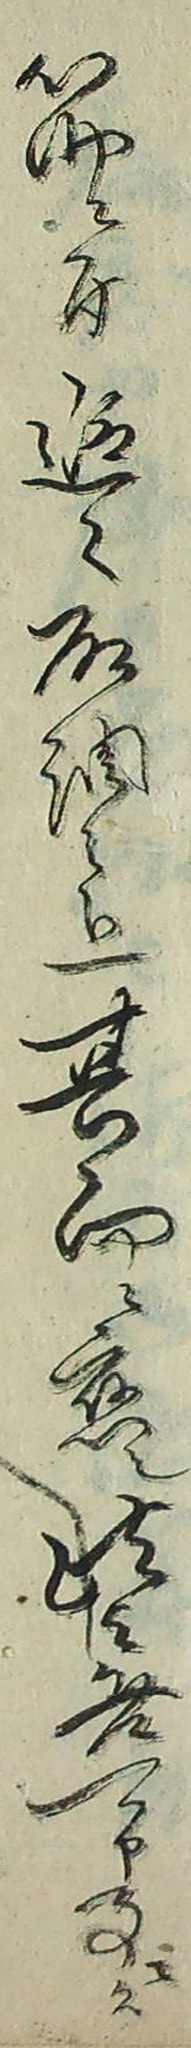筋ニ付追々取調之上其向ニ應シ屹と咎可申事ニ候
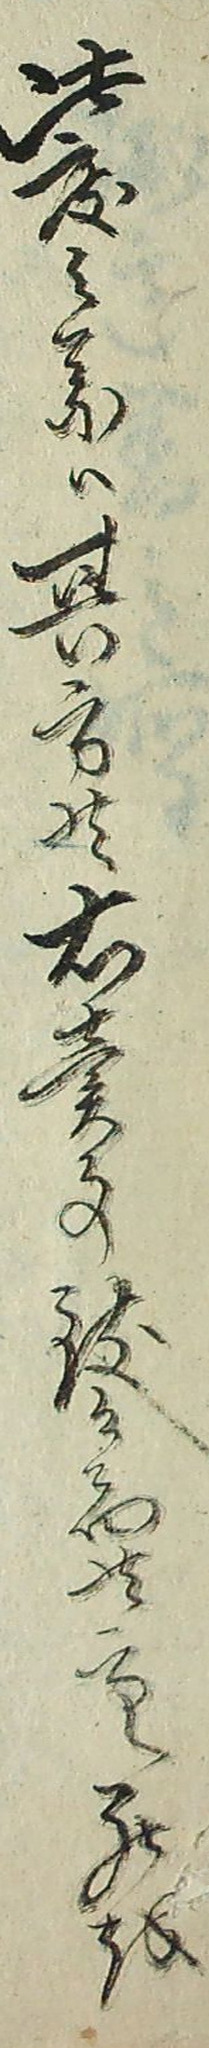此度之義ハ其方共右賣事致候者共方へ罷越
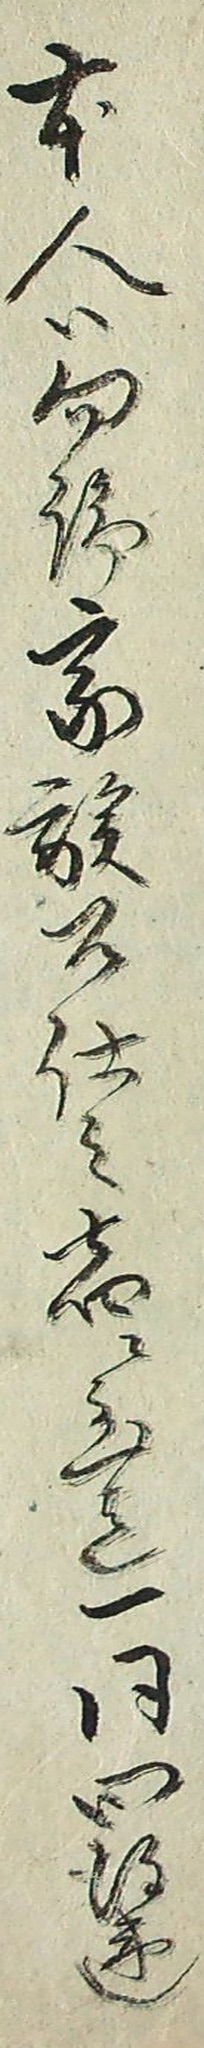本人ハ勿論家族召仕之者ニ至迄一同心得違
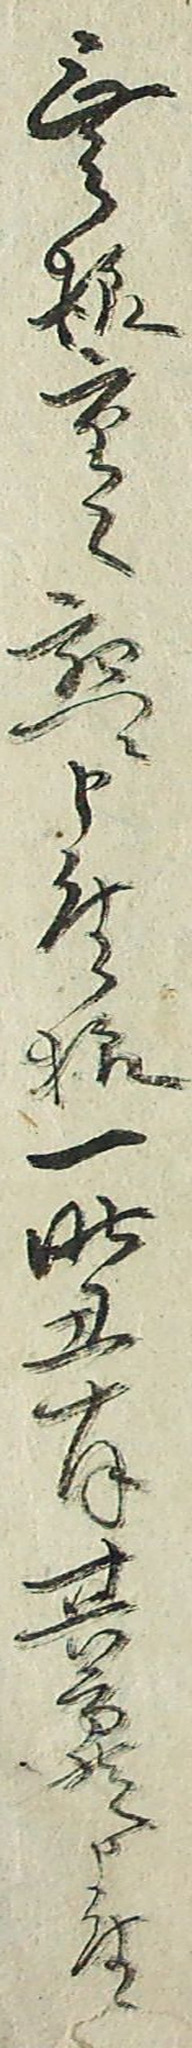無之様重々懇ニ申付候様一昨丑十月其方共へ申付候

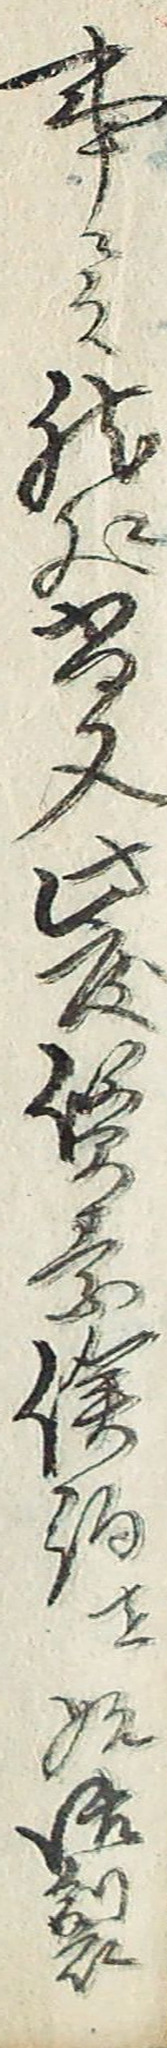事ニ候然処尚又此度質素倹約を始御製
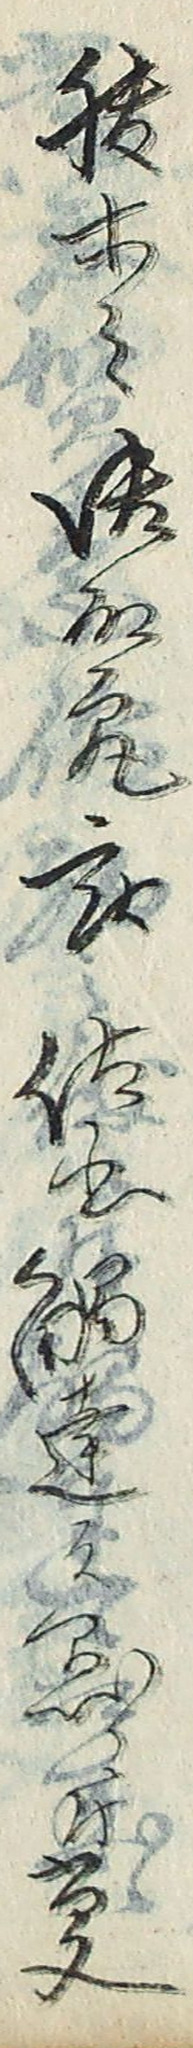服等之御取究被仰出觸達候懸りニ付尚又
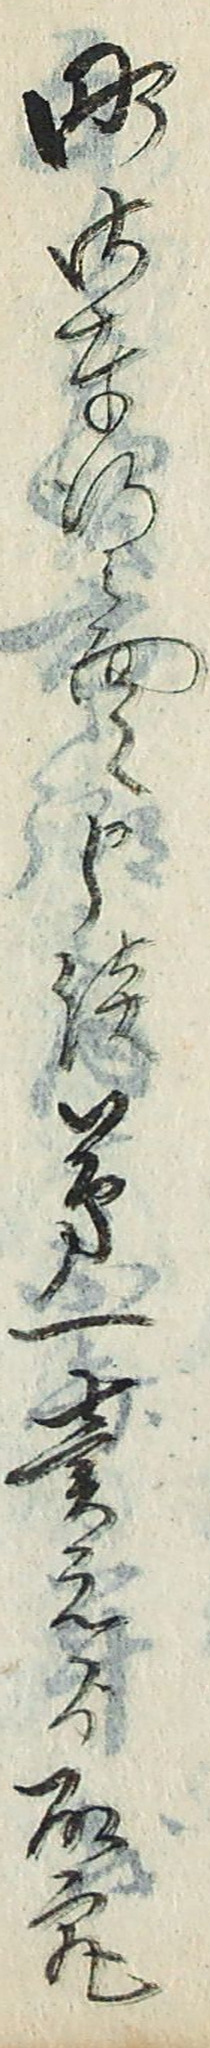町御奉行之面々申談第一賣元ゟ取究
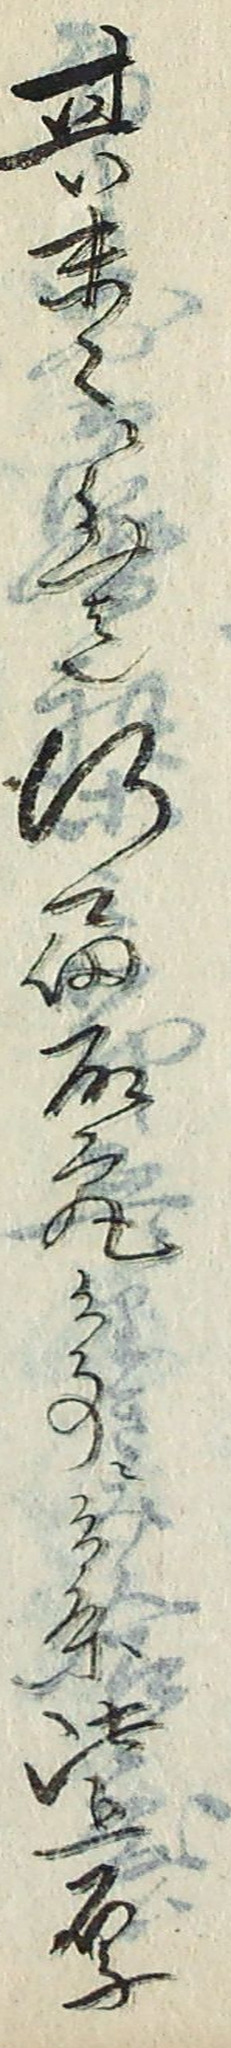其末々ニ至迄行届取究候事ニ候条此上厚
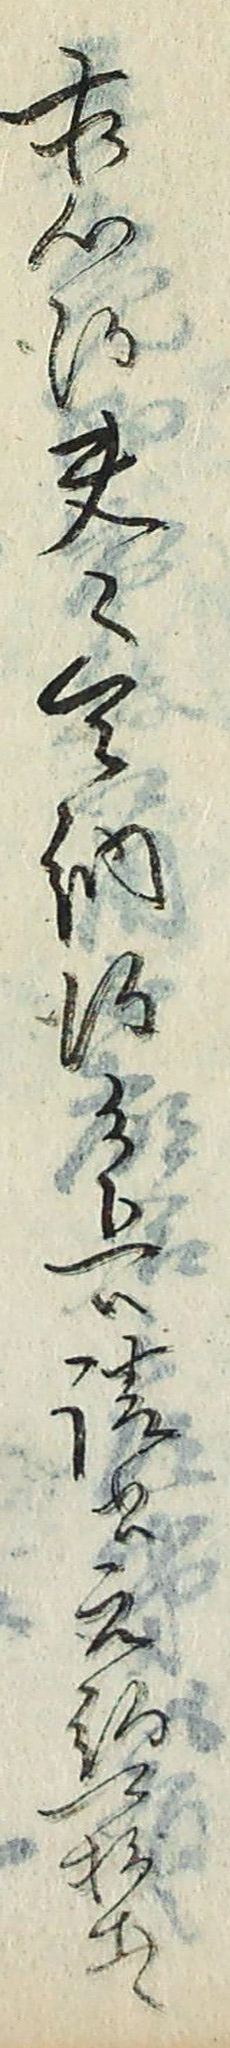相心得夫々令納得候上ハ請書取約可指出候
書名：諸御趣意書并御下知向之写
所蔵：鳴門教育大学 Naruto University of Education
